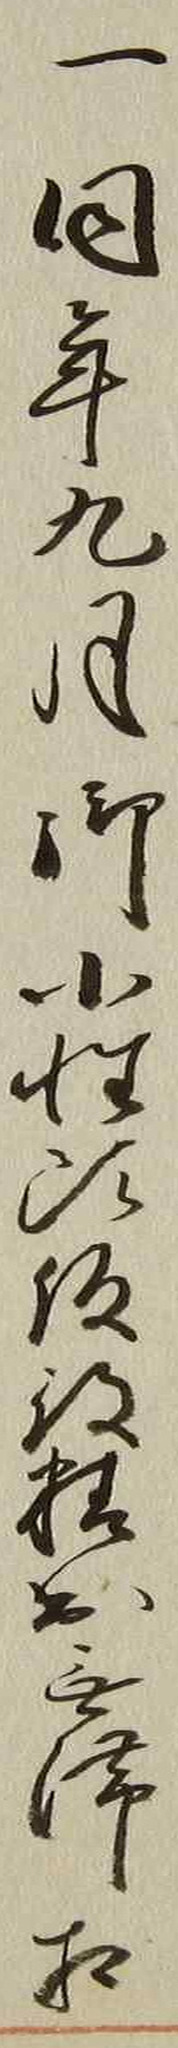一同年九月御小性頭仮役精出無滞相
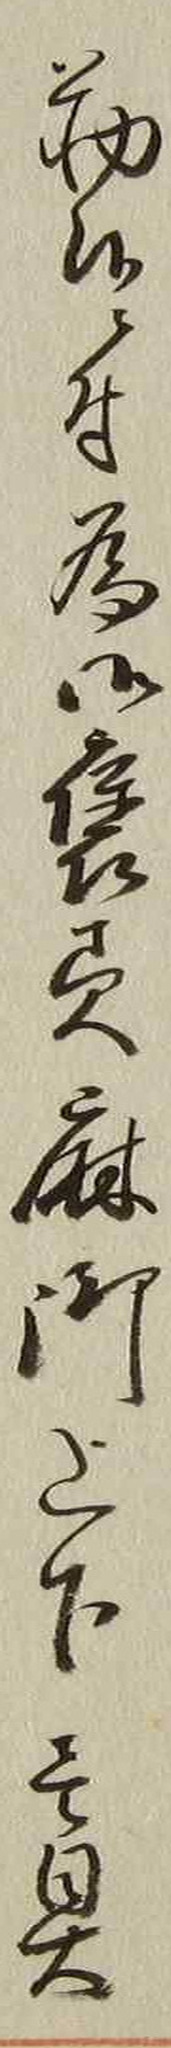勤候ニ付為御褒美麻御上下壱具
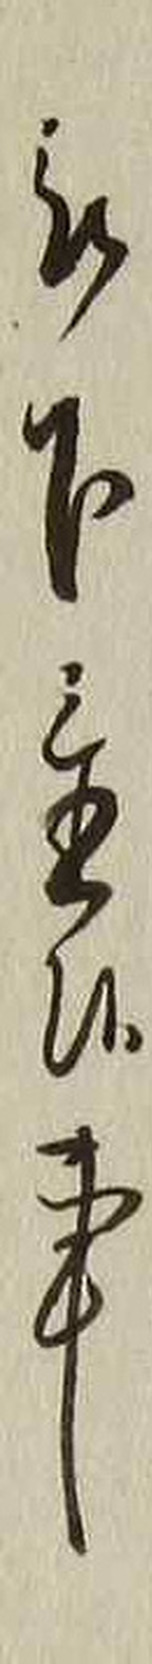被下置候事
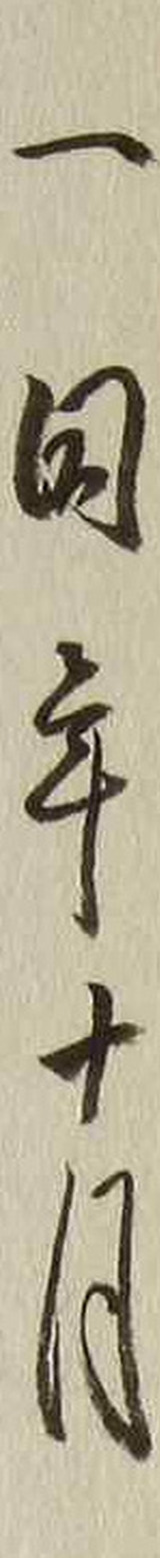一同年十月
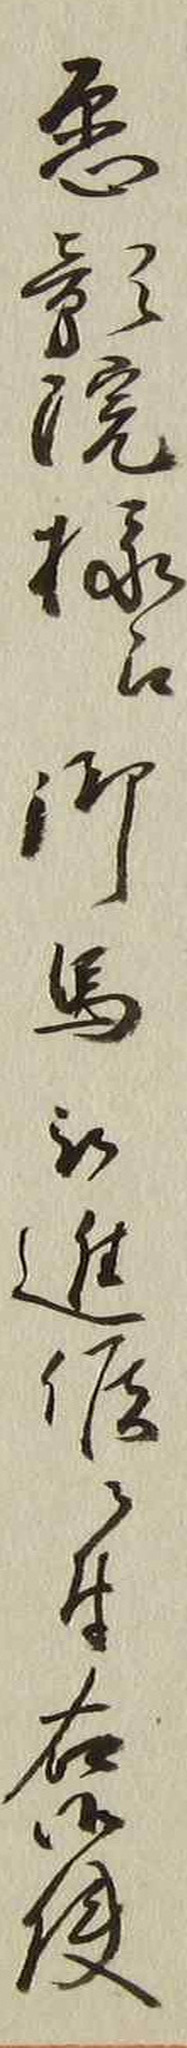愿彰院様江御馬被進候ニ付右御使
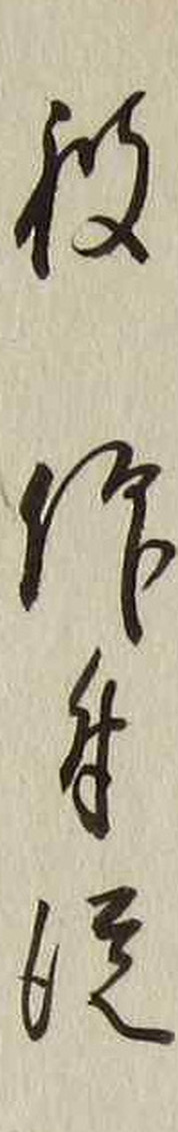被仰付従
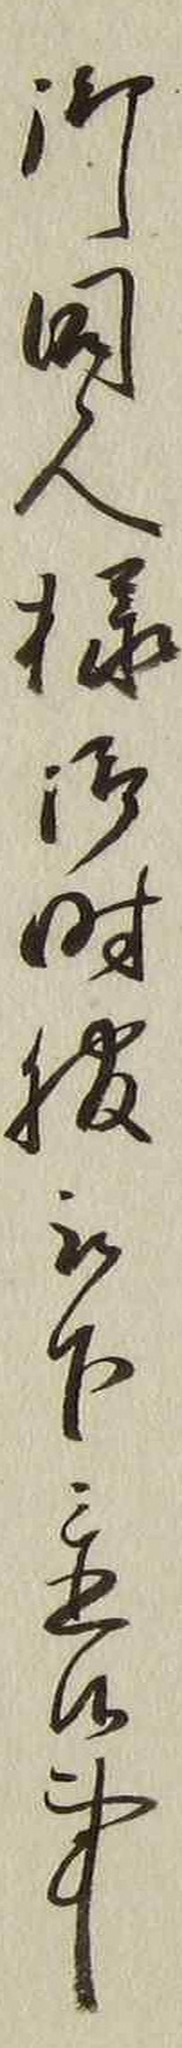御同人様御時服被下置候事
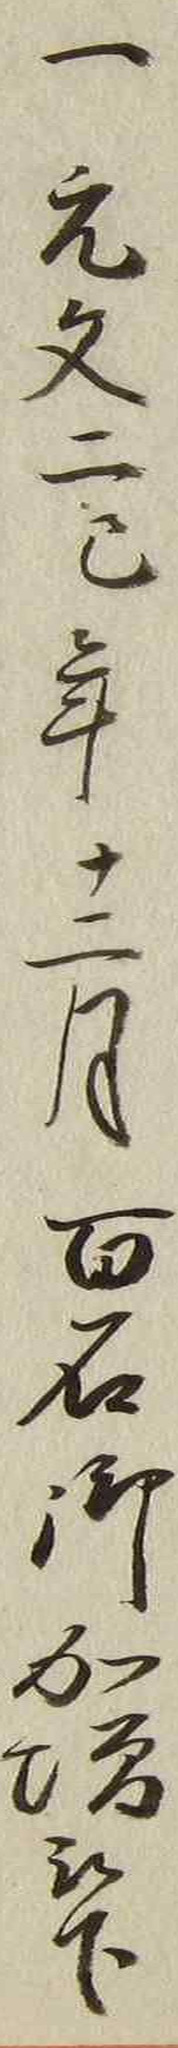一元文二巳年十二月百石御加増被下
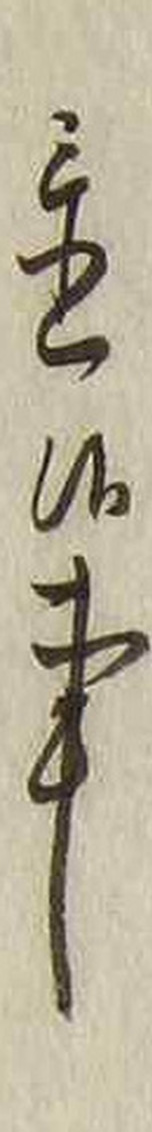置候事
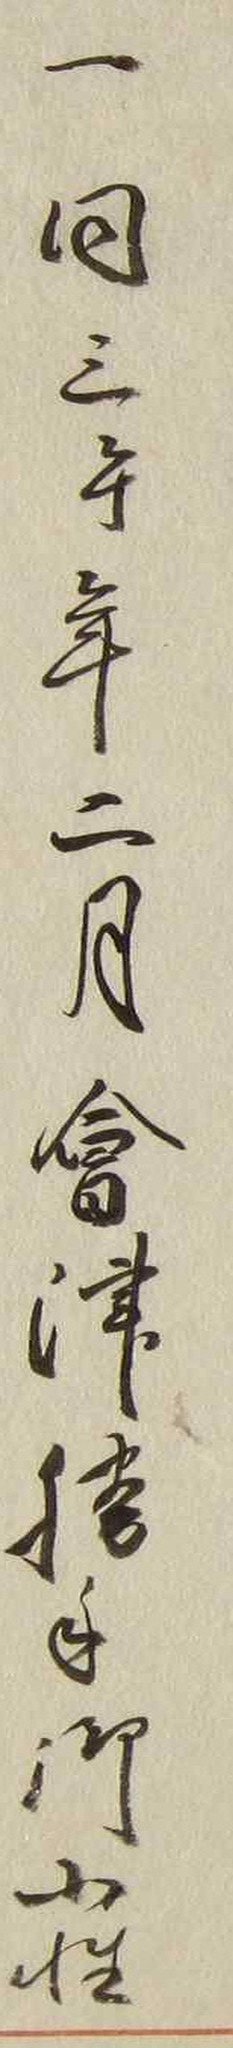一同三午年二月会津勝手御小性

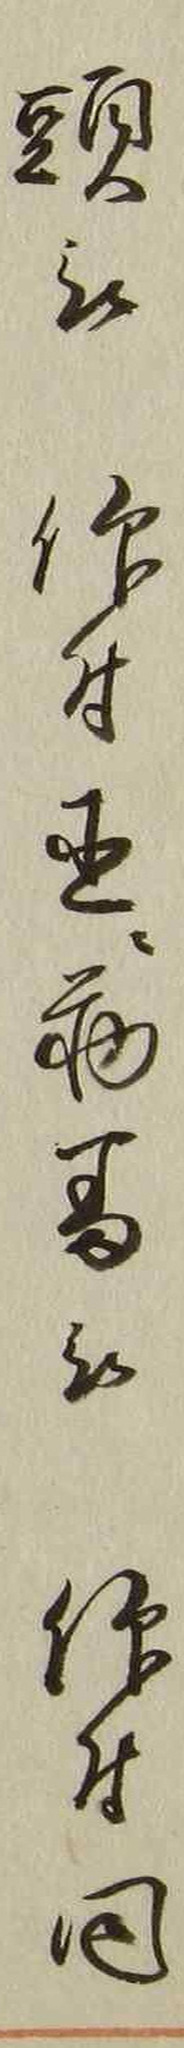頭被仰付直ニ勤番被仰付同
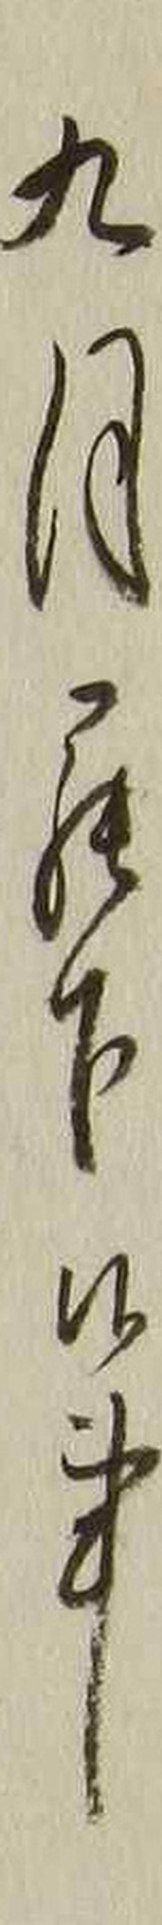九月罷下候事
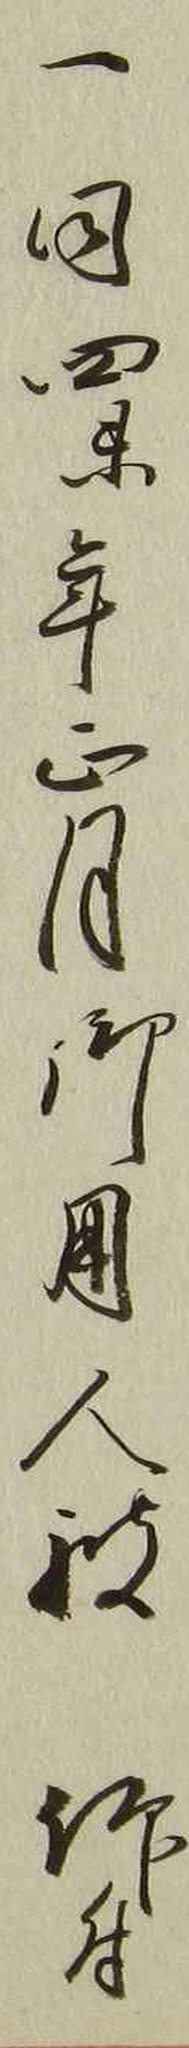一同四未年正月御用人被仰付
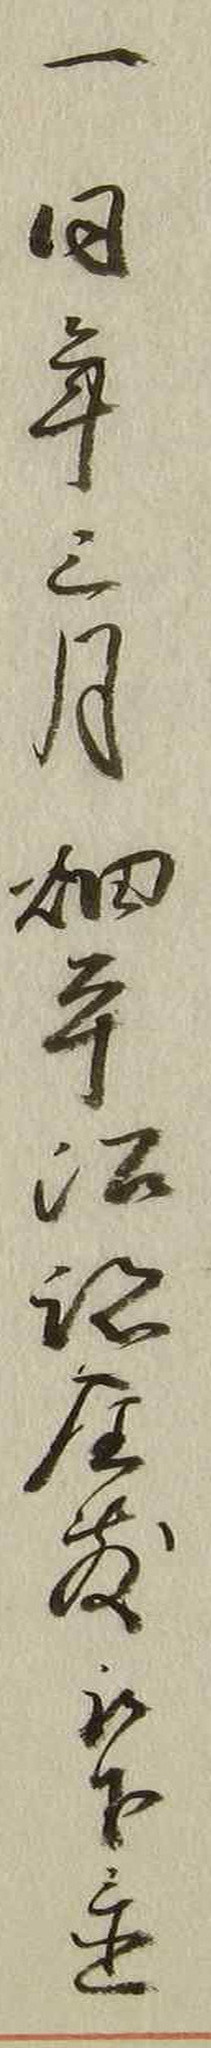一同年三月畑平沼跡屋敷被下置
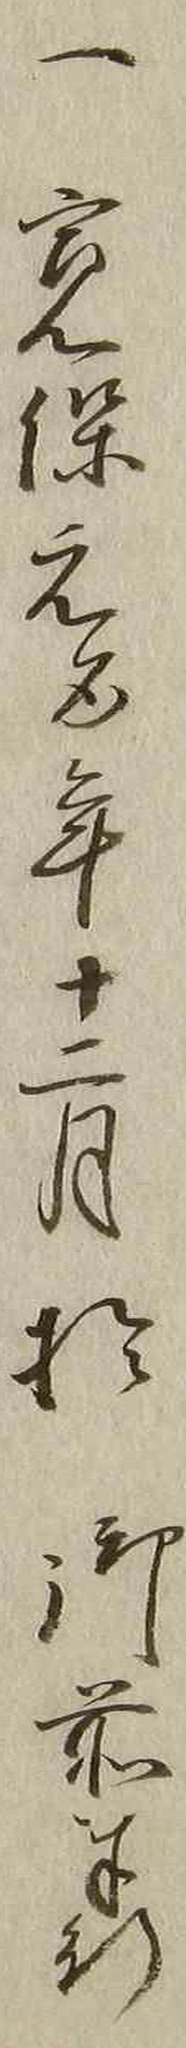一寛保元酉年十二月於御前奉行
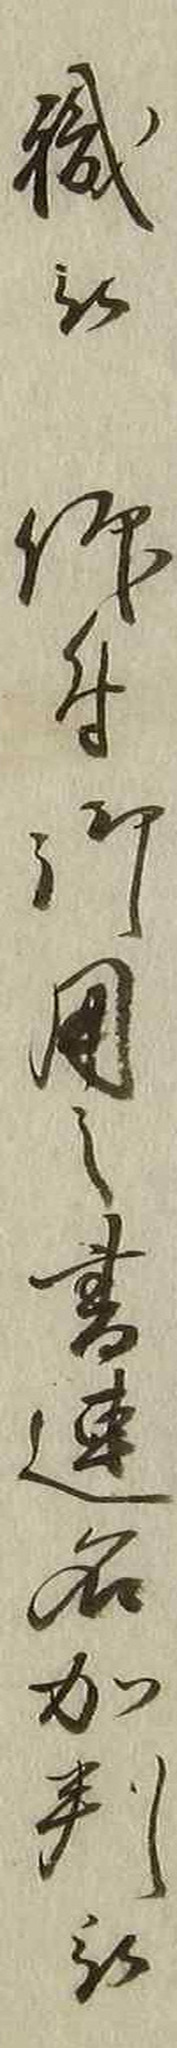職被仰付御用之書連名加判被
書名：諸士系譜　巻之122　よ之部5
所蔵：会津若松市立会津図書館
